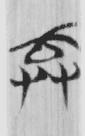弃
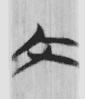文
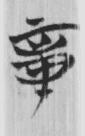章
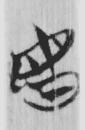{母日}
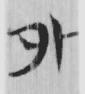外
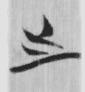之
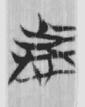者
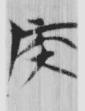侯
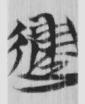{辶帚}
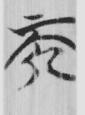而
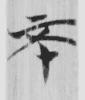不
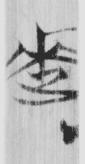麥
